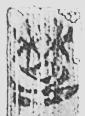楚
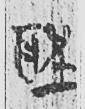聖
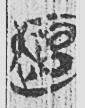𧻚
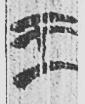王
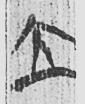立
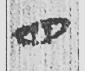四
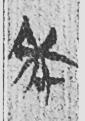年
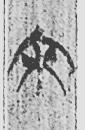宋
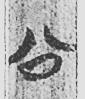公
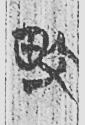畋
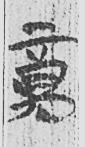奠
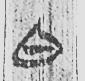白
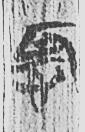怠
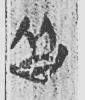皆
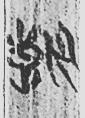朝
